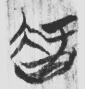智
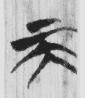天
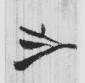之
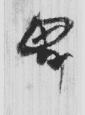畏
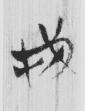{十戈}
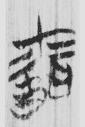{尒䎽}
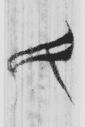民
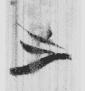之
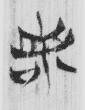若
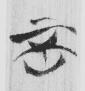否
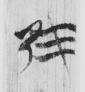隹
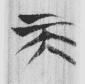天
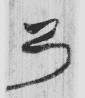乃
